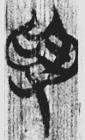受
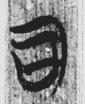司
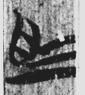馬
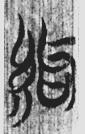○（治）
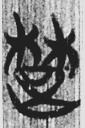楚
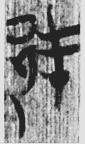邦
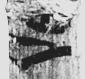之
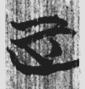正（政）
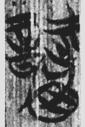○（黔）
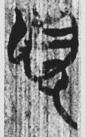頁（首）
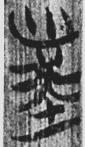○（萬）
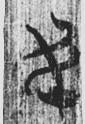民
